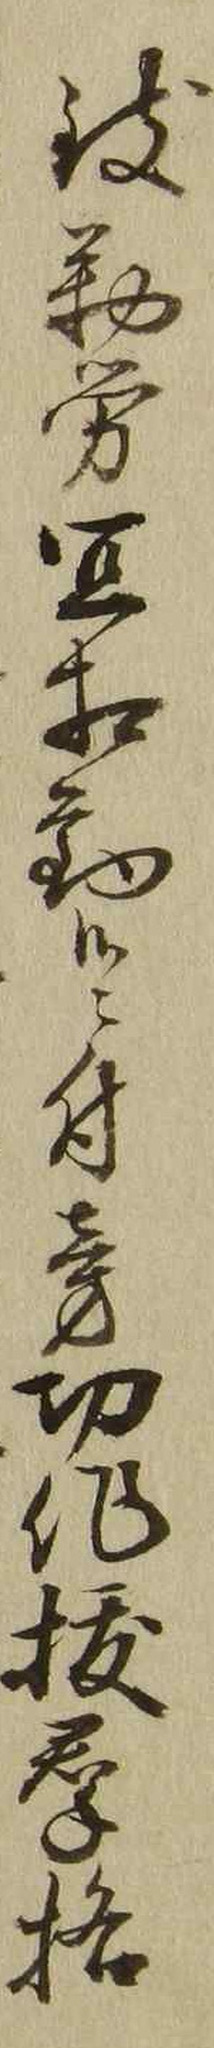致勤労宣相勤候様ニ付旁功作抜群格
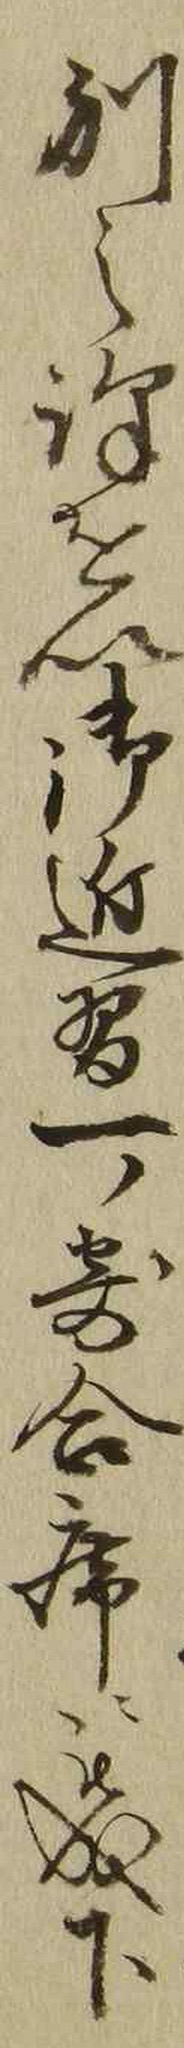別の訳を以御近習一ノより寄合席ニ被成下
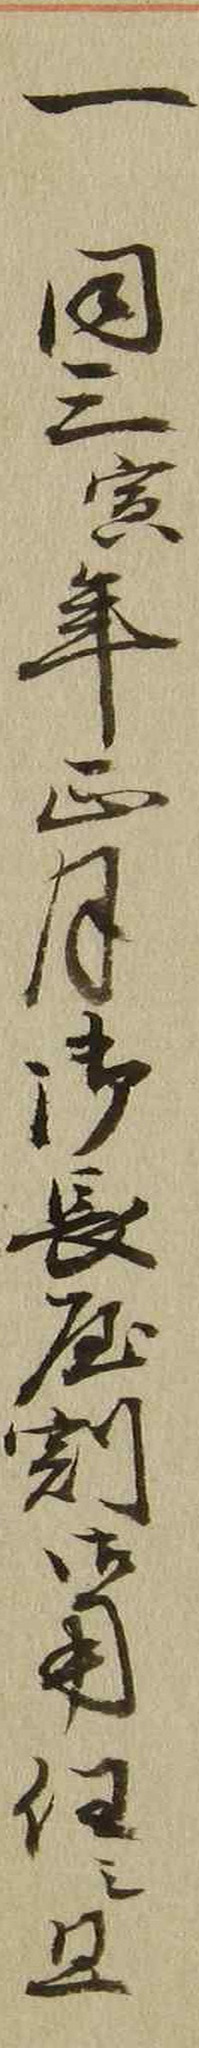一同二寅年正月御長屋割御用任シ且
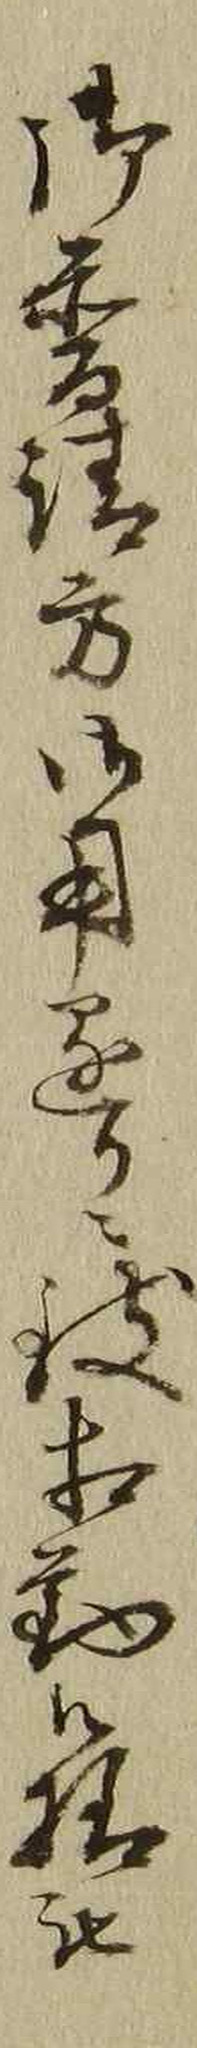御普請方御用懸りニ相勤候様被
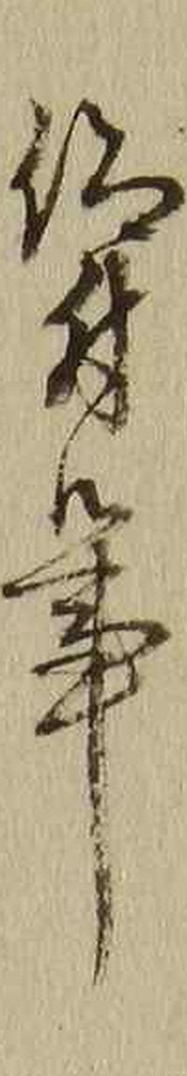仰付候事
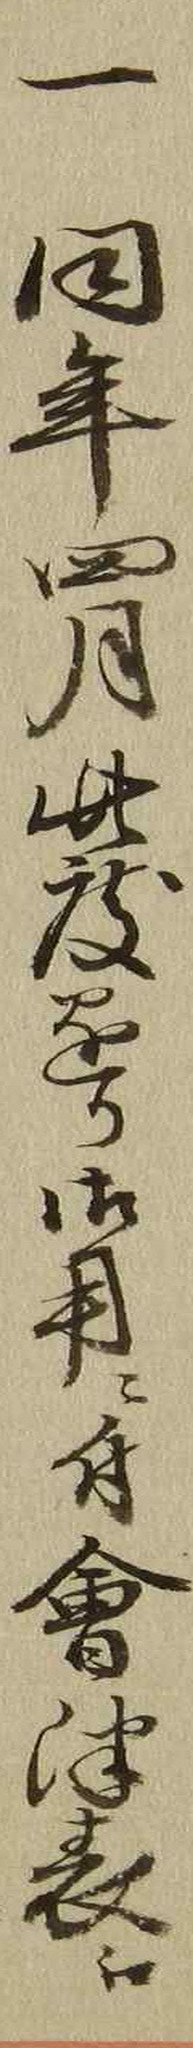一同年四月此度懸り御用ニ付会津表江
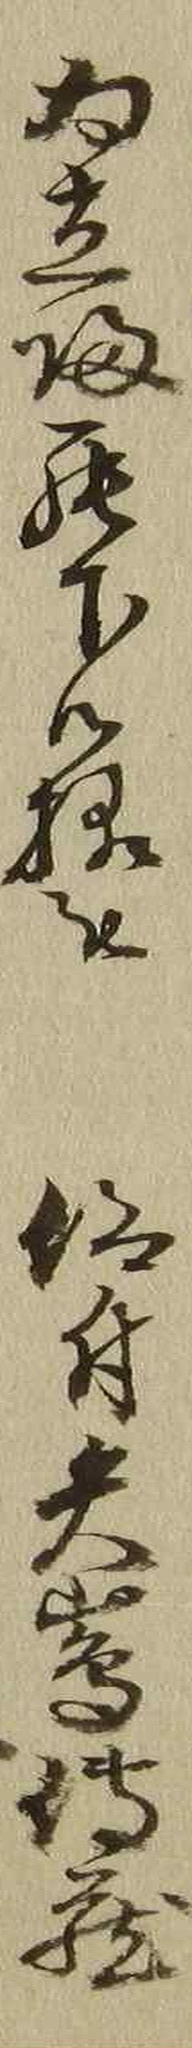為立帰罷下候様被仰付矢島傳蔵
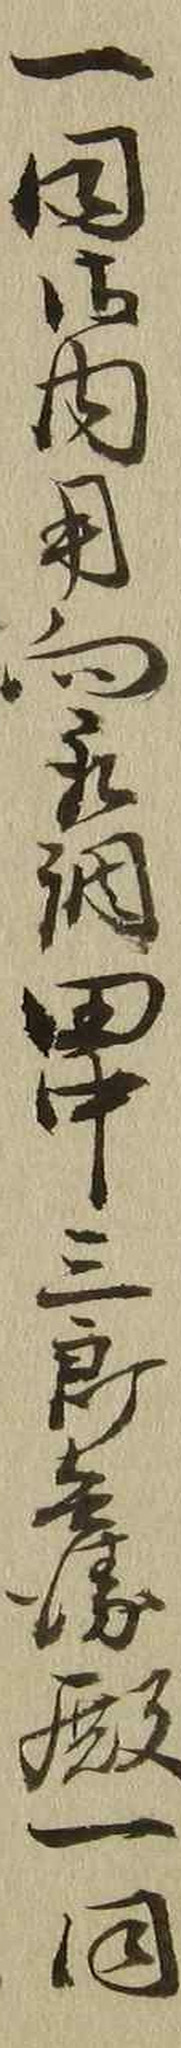一同御内用向取調田中三郎兵衛殿一同
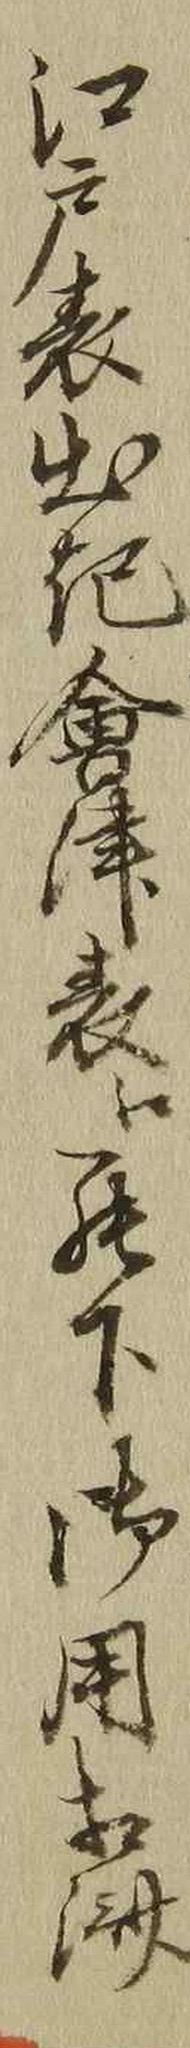江戸表出起会津表江罷下御用相済
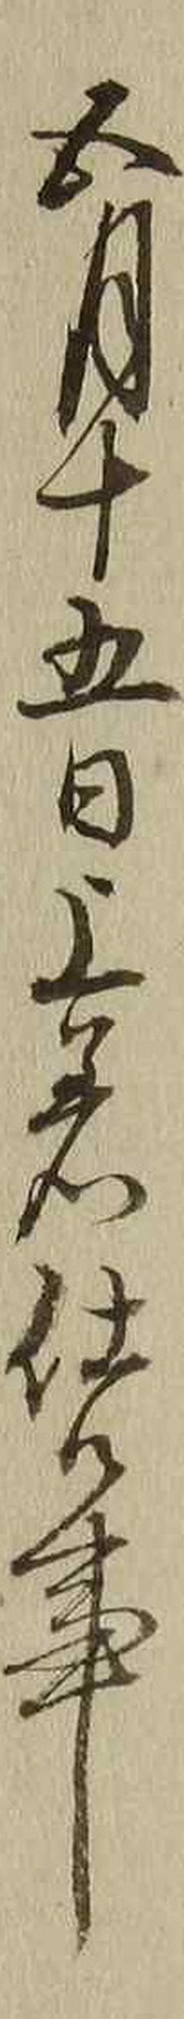五月十五日上着仕候事
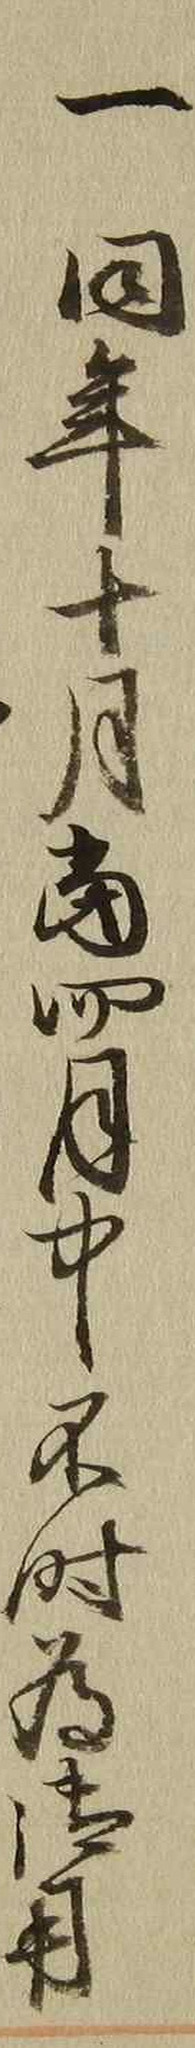一同年十月当四月中不時為御用
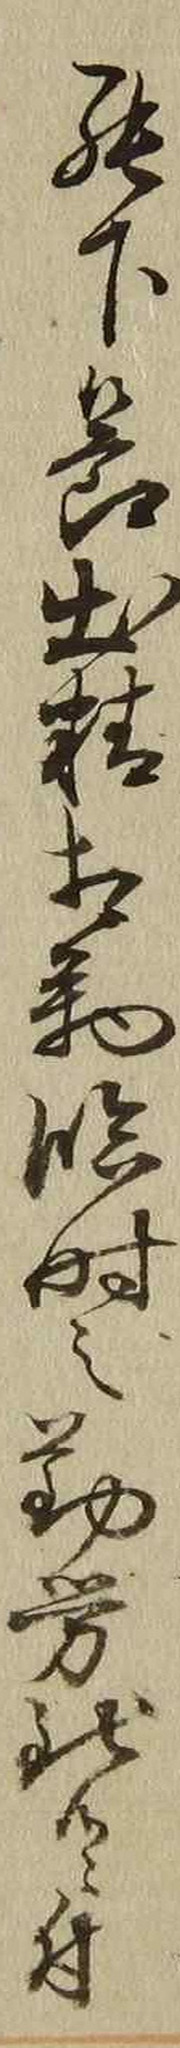罷下候節出精相勤臨時之勤労致候ニ付
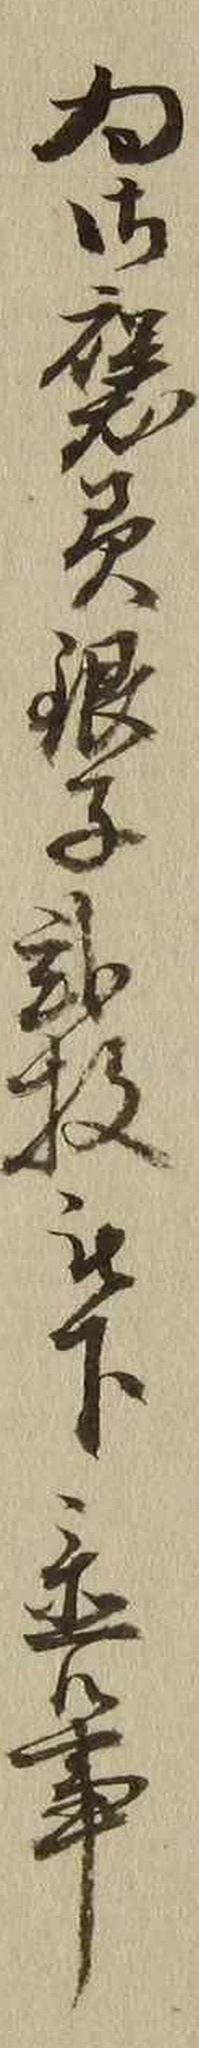為御褒美銀子弐枚被下置候事
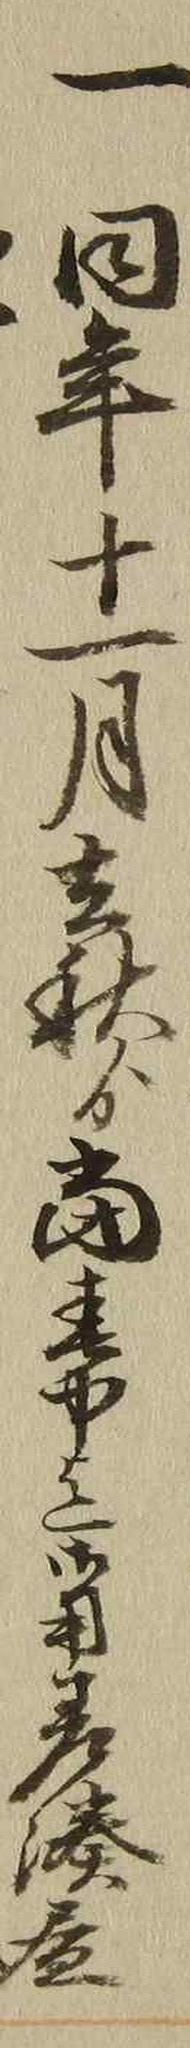一同年十一月去秋ゟ当春中迄御用差湊屋
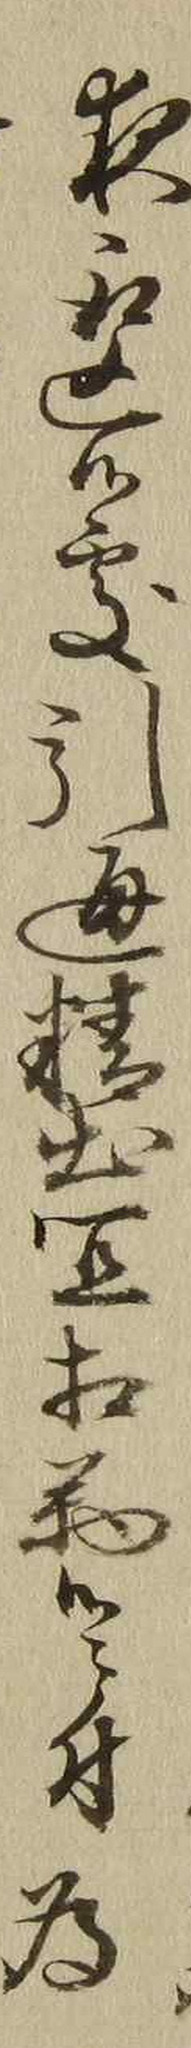夜取込候處引通精出宜相勤候ニ付為
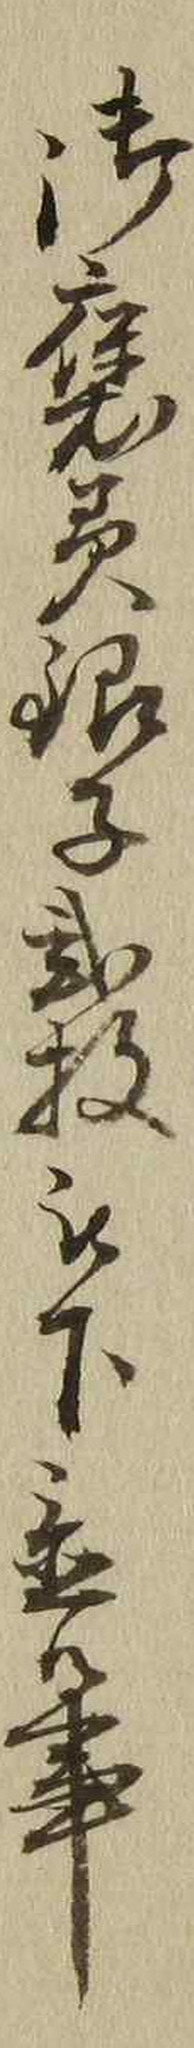御褒美銀子弐枚被下置候事
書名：諸士系譜　巻之64　と之部7
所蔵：会津若松市立会津図書館
